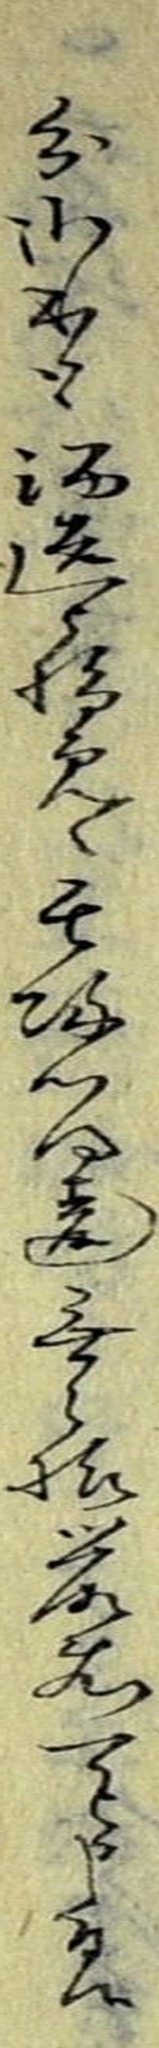分弐本ツゝ酒造被指免候其餘心得違無之様厳敷可被申付候
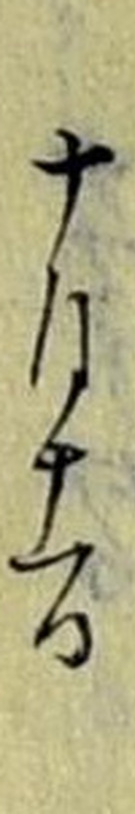十月十一日

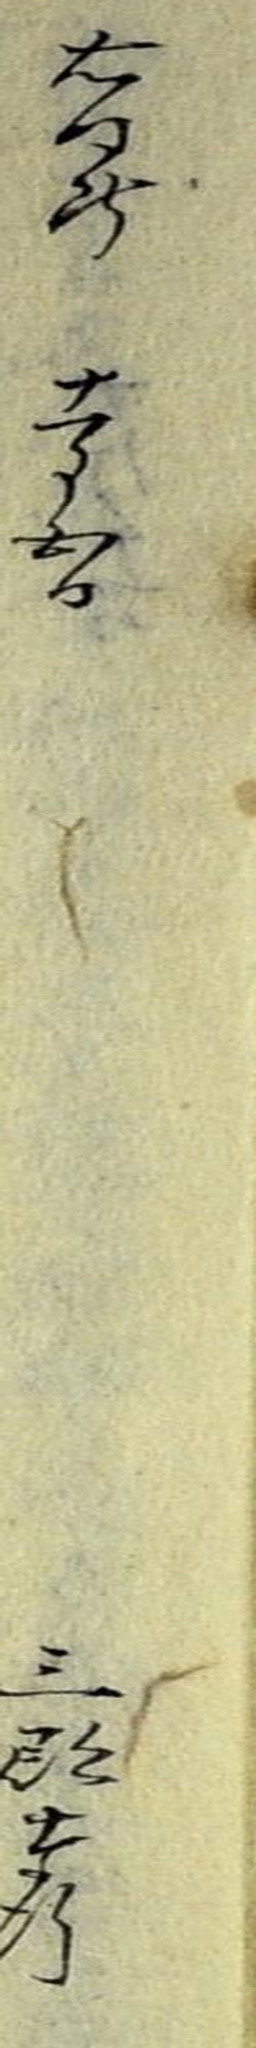○右同断十一月五日三郡奉行
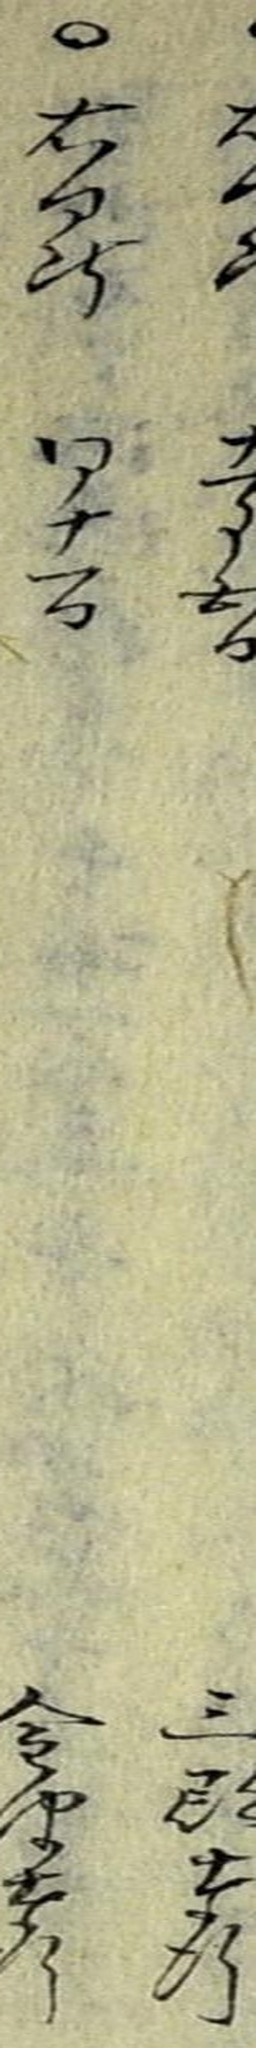○右同断同十一日金津奉行
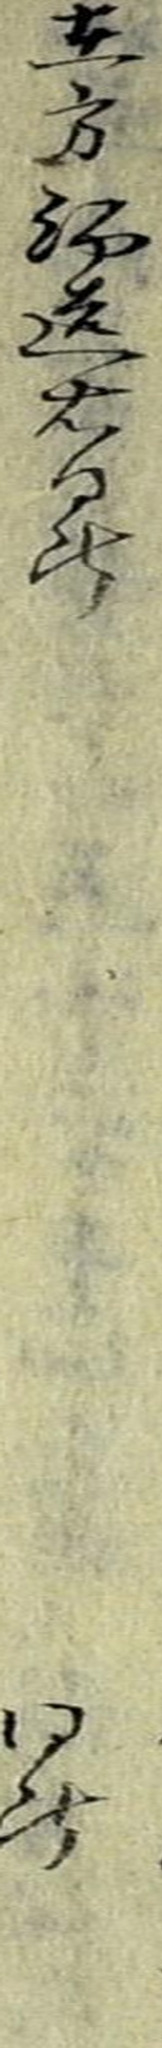○在方酒造右同断同断
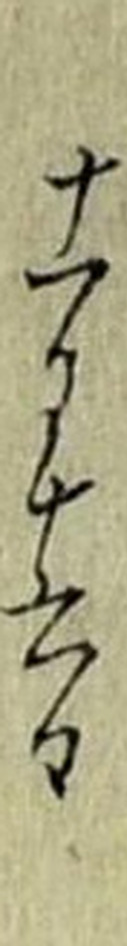十一月十六日
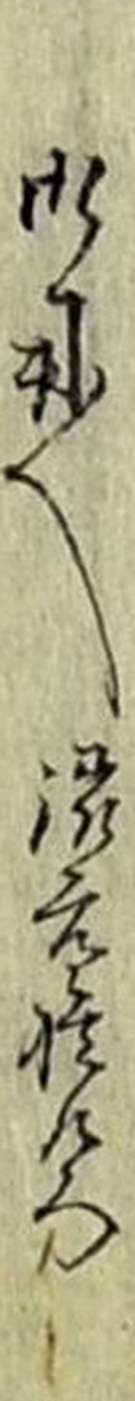御用人渋谷権左衛門
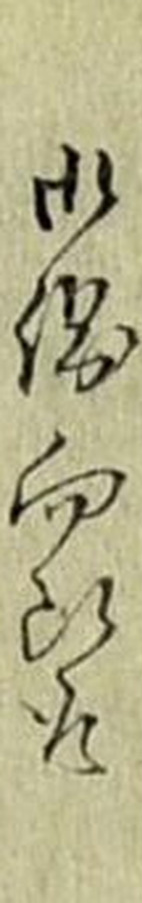御側向頭取
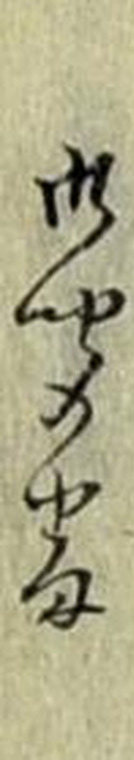御聞番
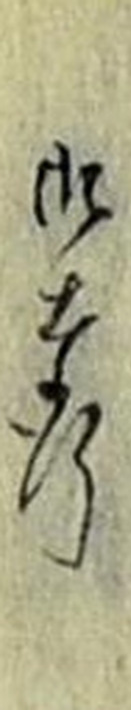御奉行
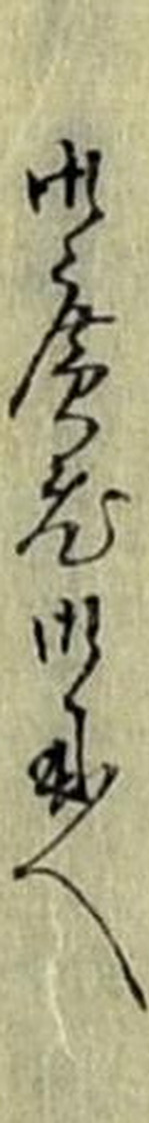御広敷御用人
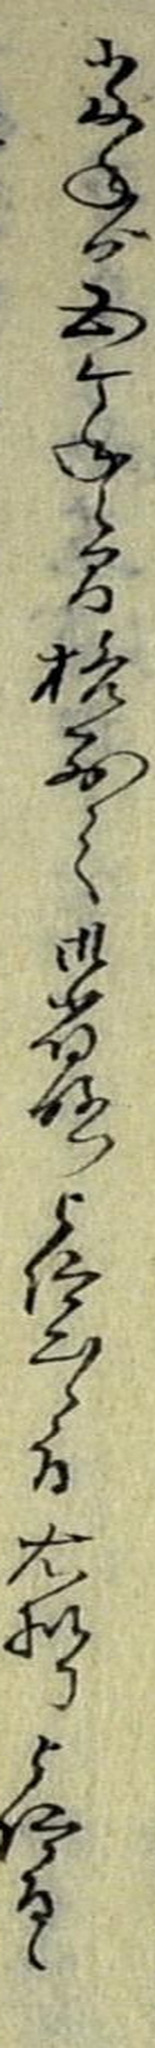○当年ゟ五ケ年之間格別之御省略被仰出候に付右掛り被仰付候
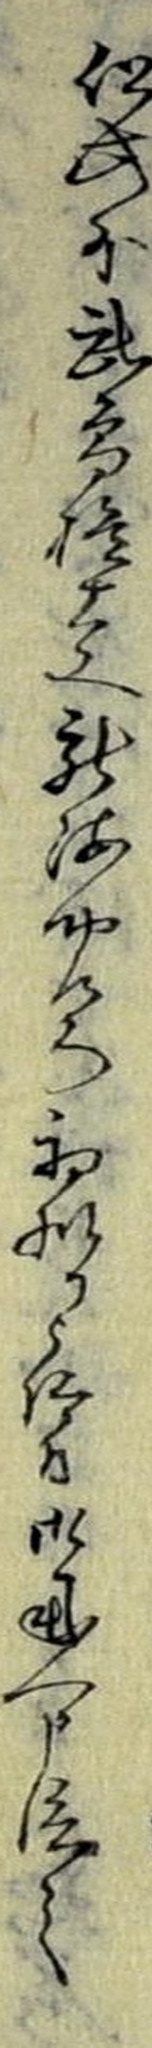但此外武曽権太夫新海助左衛門初掛り被仰付御用人申渡之
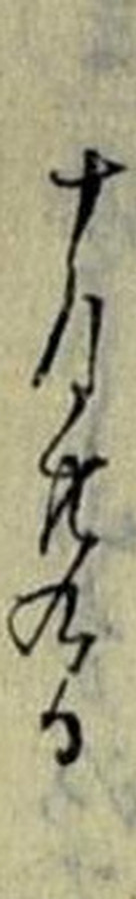十月廿九日
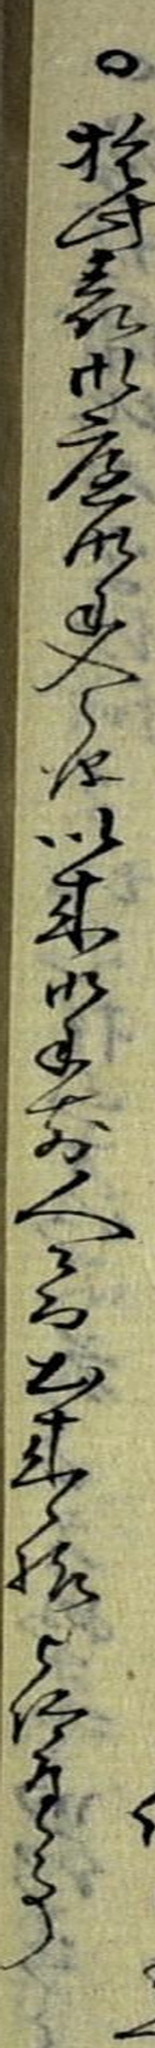○於此表御庭御手入之儀以来御手前人に而出来候様被仰付候事
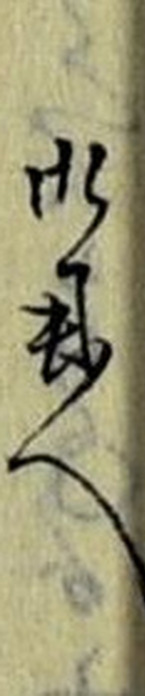御用人
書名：命令之部 六
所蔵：福井県文書館 Fukui Prefectural Archives
